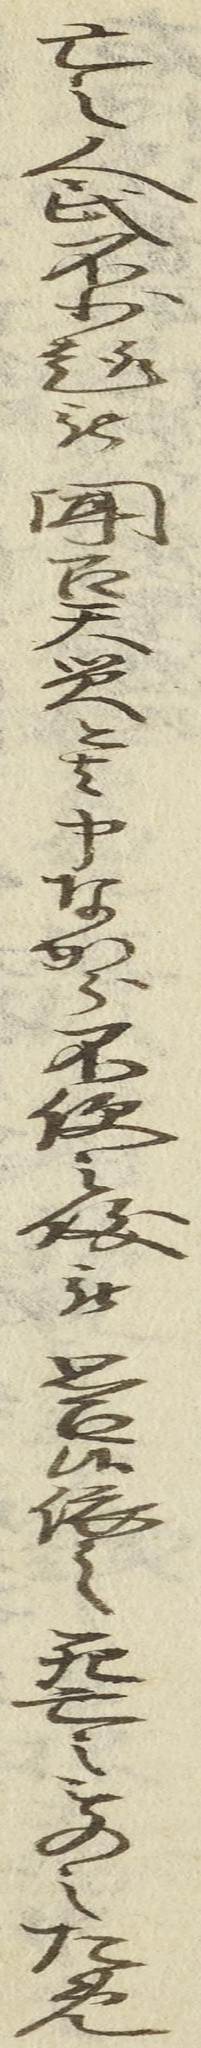亡之人民不少趣被聞召天災と者申なから不便之儀被思召候依之死亡之もの之ため
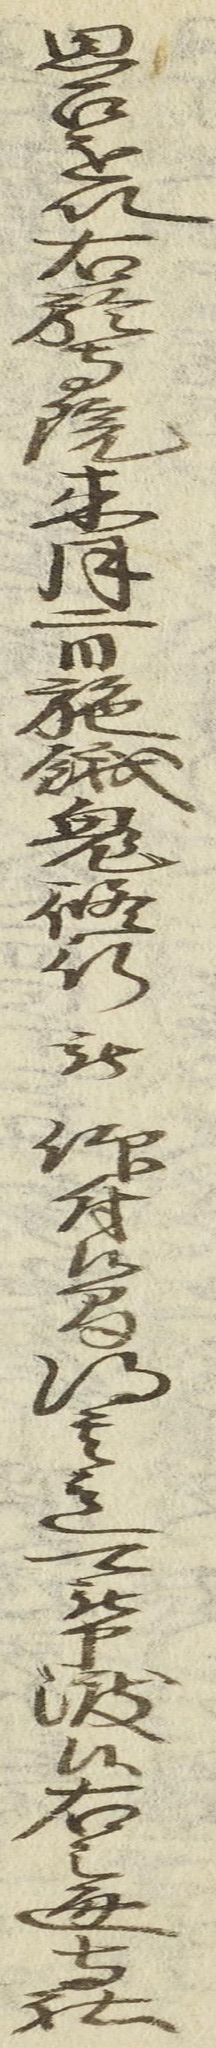思召を以右於寺院来月二日施餓鬼修行被仰付候間得其意可被申渡候右之通寺社
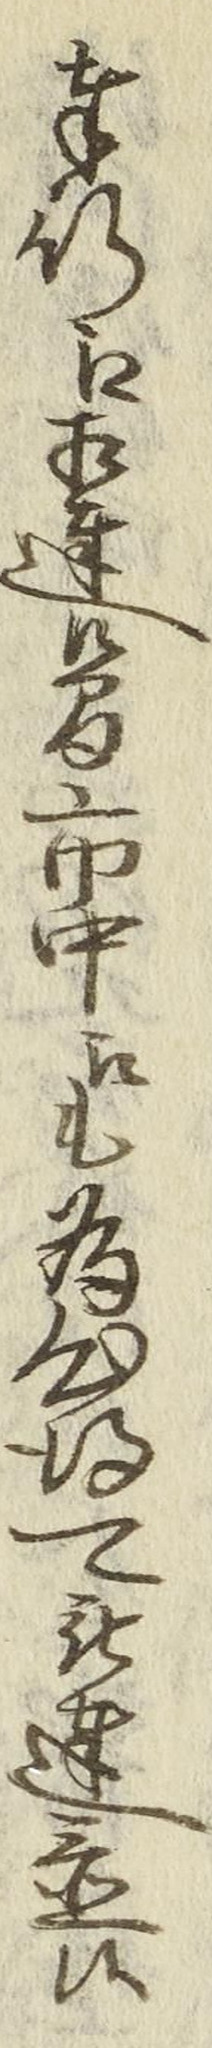奉行江相達候間市中江も為心得可被達置候
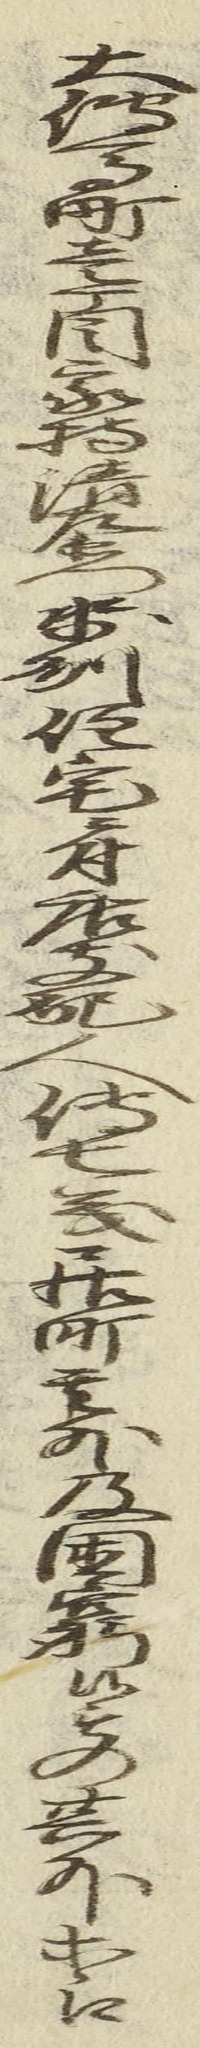一大伝馬丁壱丁目家持清左衛門勢州住宅ニ付店支配人伝七義居町其外及困窮候もの其外等江
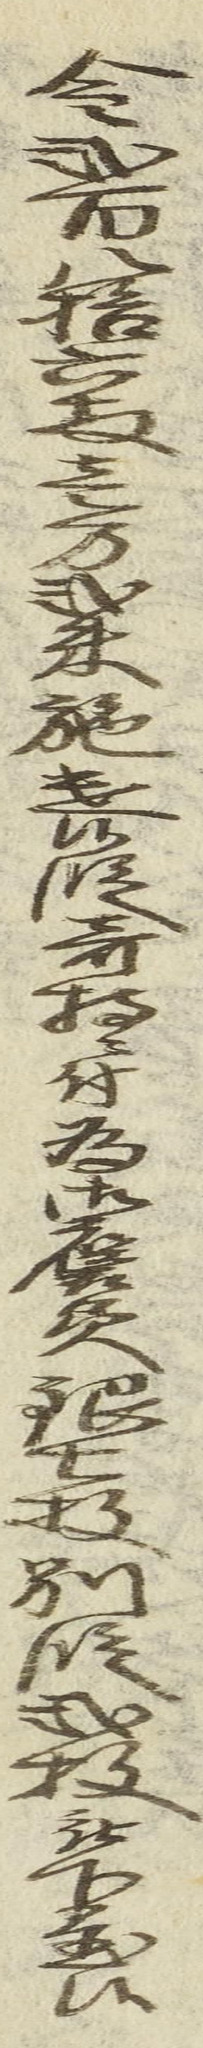金弐百八拾六両壱分弐朱施遣候段奇特ニ付為御褒美銀七枚別段弐枚被下置候
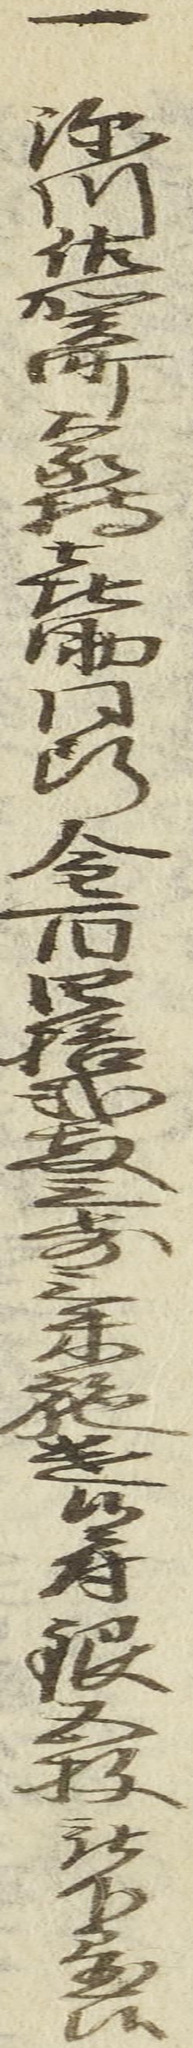一深川佐賀町家持喜助同断金百四拾弐両三歩三朱施遣候ニ付銀五枚被下置候
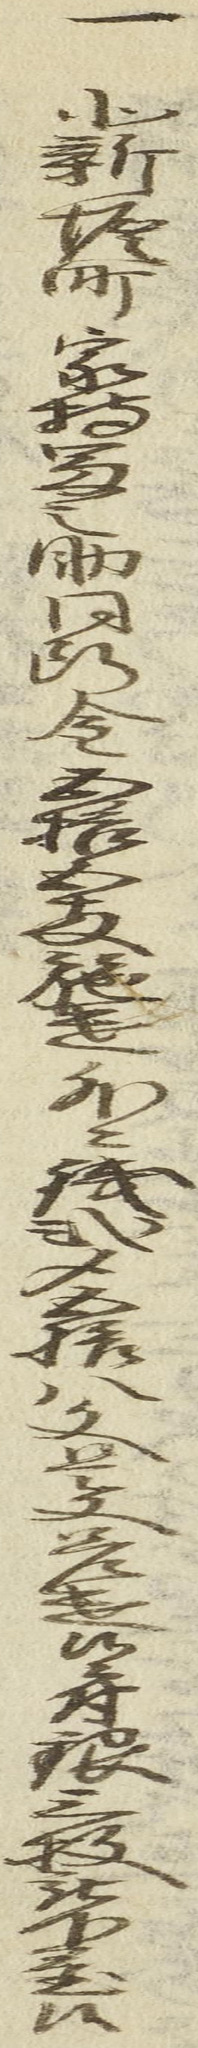一北新堀町家持冨之助同断金五拾五両施遣外ニ銭弐貫五拾八文是又差遣候ニ付銀三枚被下置候
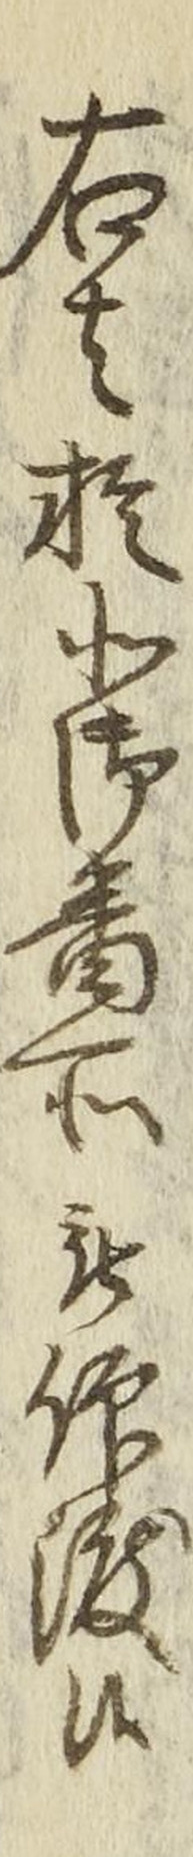右者於北御番所被仰渡候

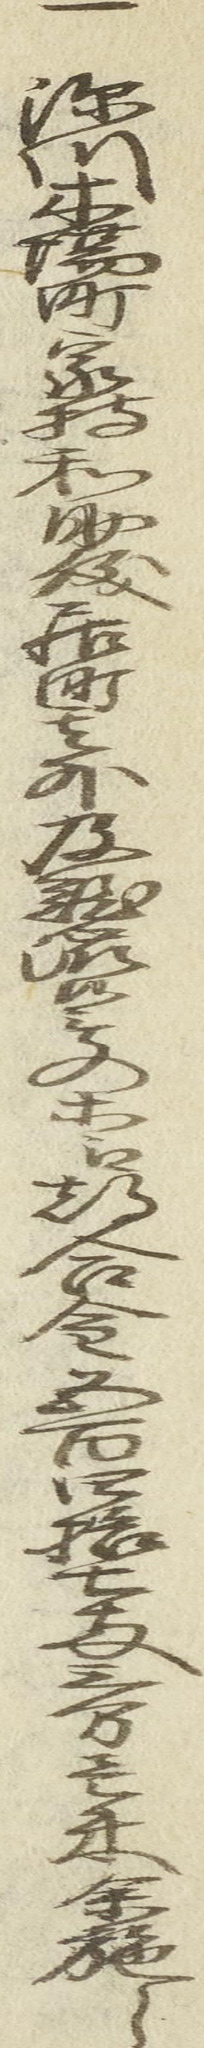一深川木場町家持和助儀居町其外及難渋候もの等江都合金五百四拾七両三分壱朱余施し
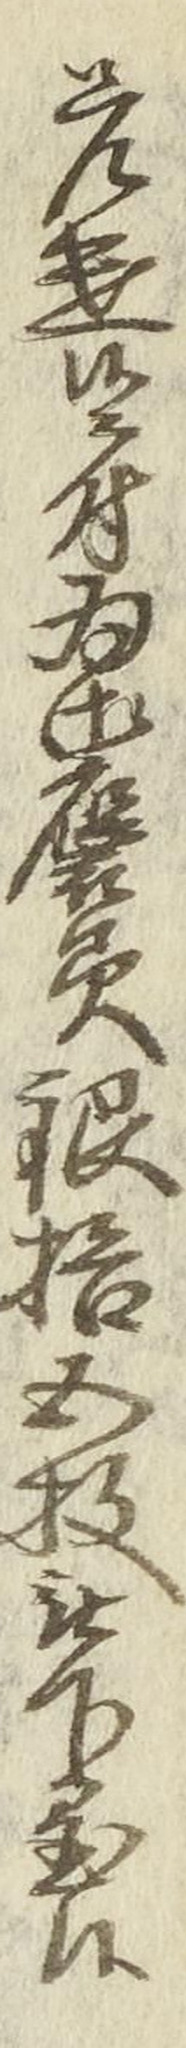差遣候ニ付為御褒美銀拾五枚被下置候
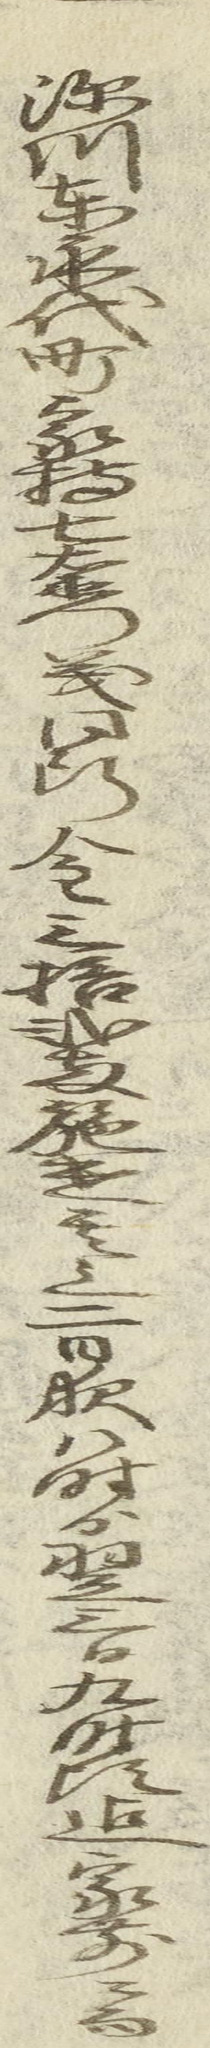一深川東永代町家持七右衛門義同断金三拾弐両施遣其上二日夜八時ゟ翌三日九時頃迄家前ニ而
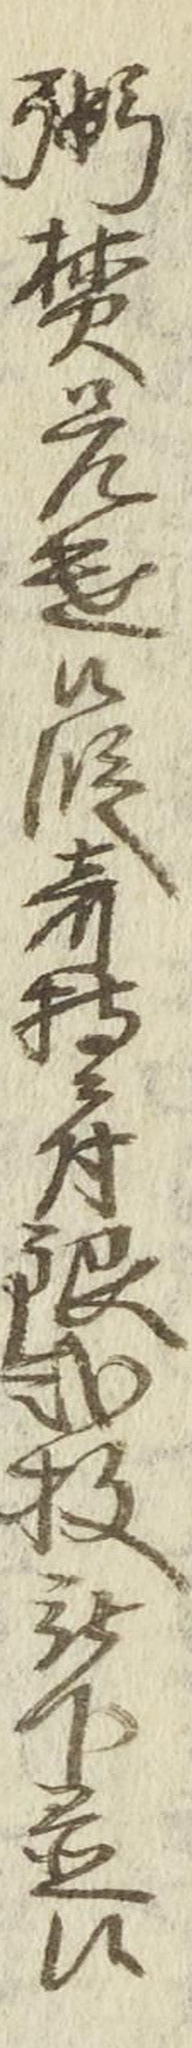粥焚差遣候段奇特ニ付銀弐枚被下置候
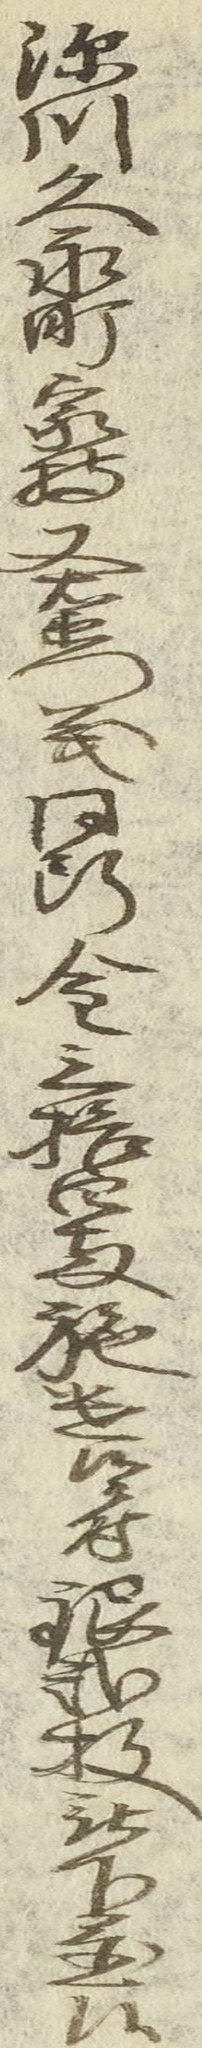深川久永町家持又右衛門義同断金三拾四両施遣候ニ付銀弐枚被下置候
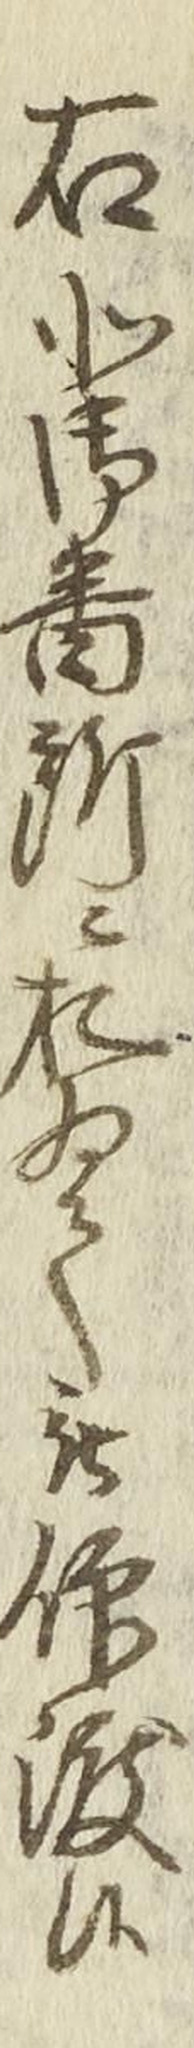右北御番所ニ於ゐて被仰渡候
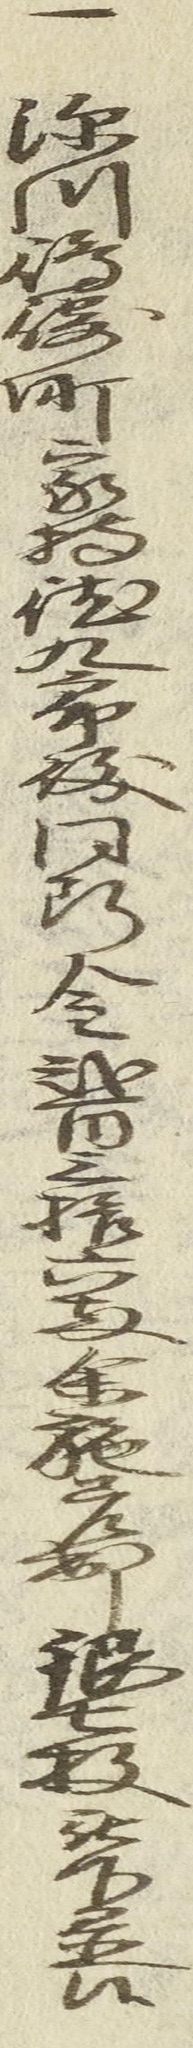一深川嶋崎町家持徳九郎儀同断金弐百三拾六両余施差出し銀七枚被下置候
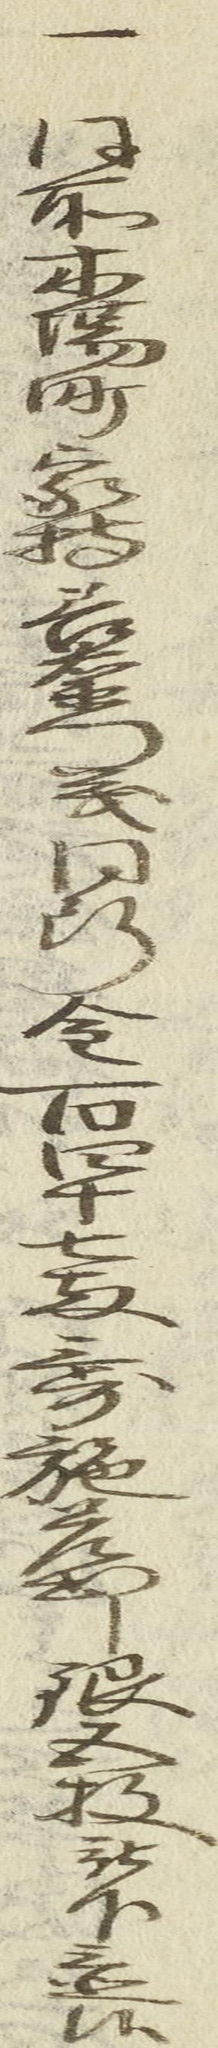一同所木場町家持善右衛門義同断金百四十七両三歩施差出し銀五枚被下置候
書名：安政二年震災記事　完
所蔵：東京大学地震研究所図書室 Earthquake Research Institute Library, The University of Tokyo, JAPAN
